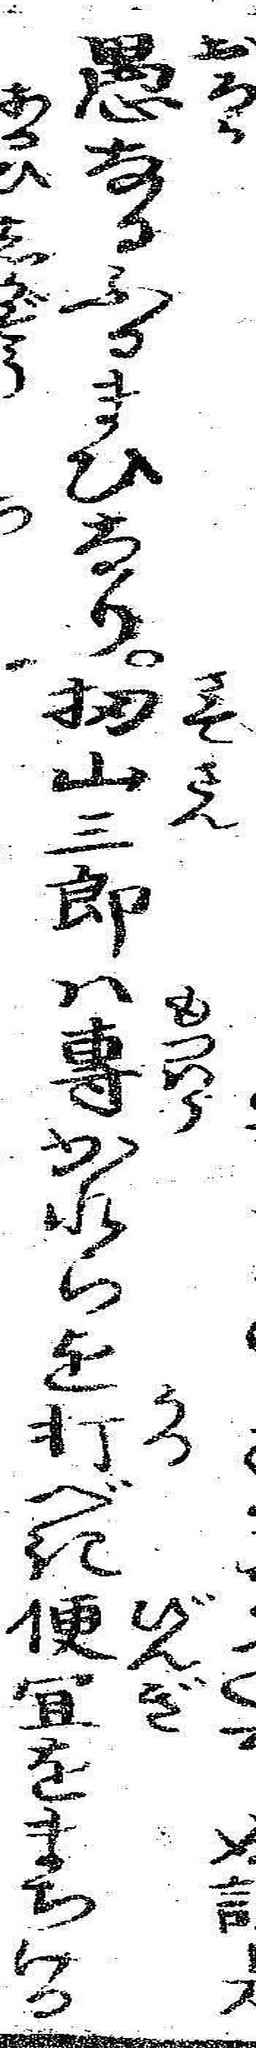愚なるふるまひなり。扨山三郎は専かれらを打べき便宜をまちける
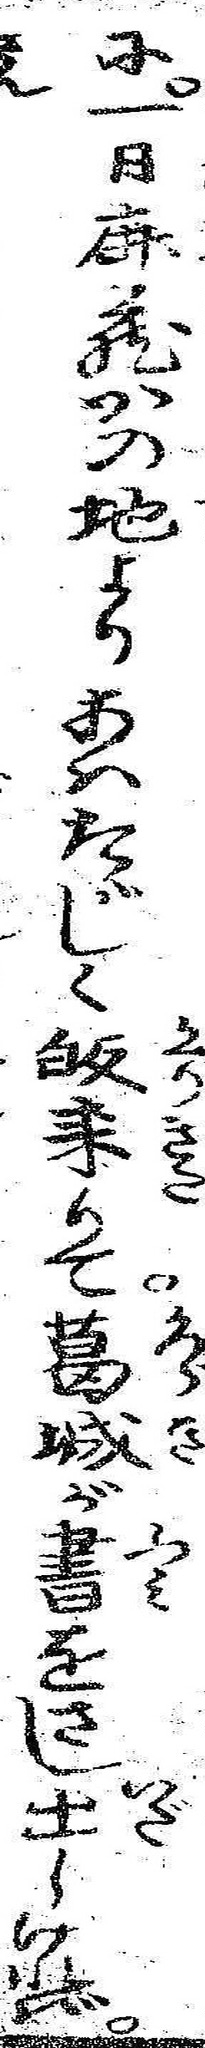に。一日鹿蔵かの地よりあはたゞしく帰来りて。葛城が書をさし出しければ。
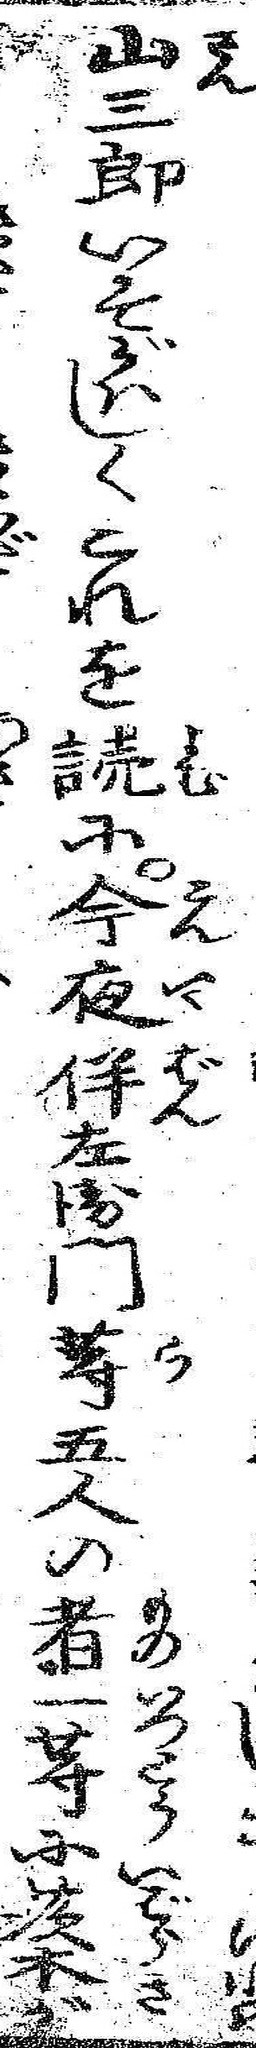山三郎いそがはしくこれを読に。今夜伴左衛門等五人の者一等に茨木が
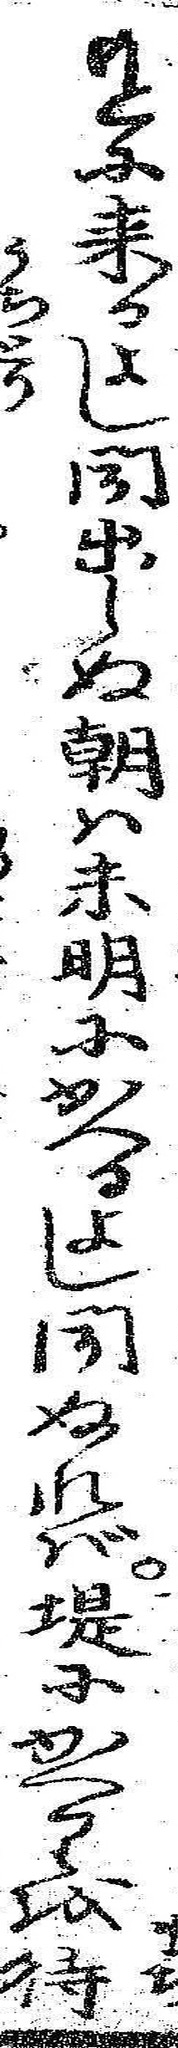もとに来るよし聞出しぬ。朝は未明にかへるよし聞ぬれば。堤にかへりを待
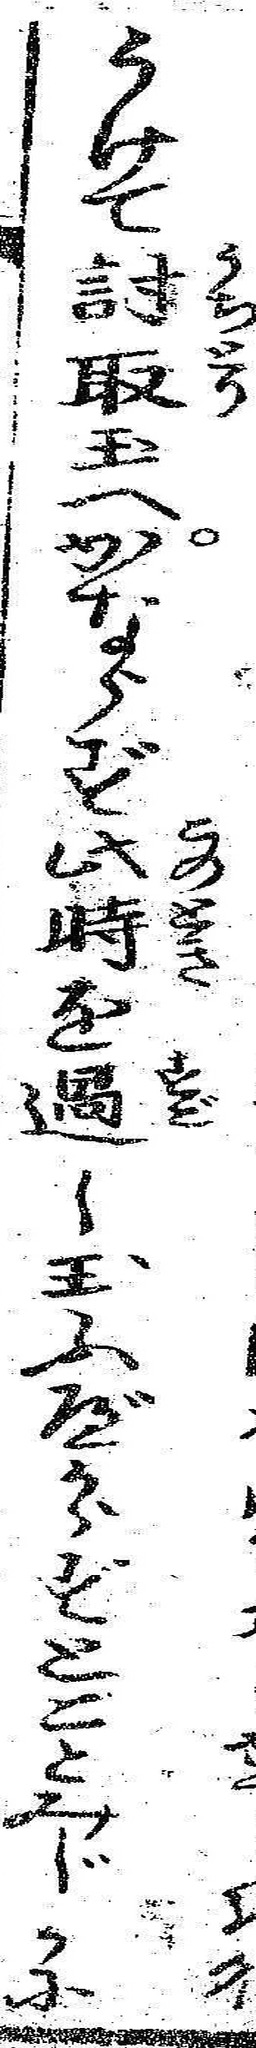うけて討取玉へ。かならず此時を過し玉ふべからずとことみじかに

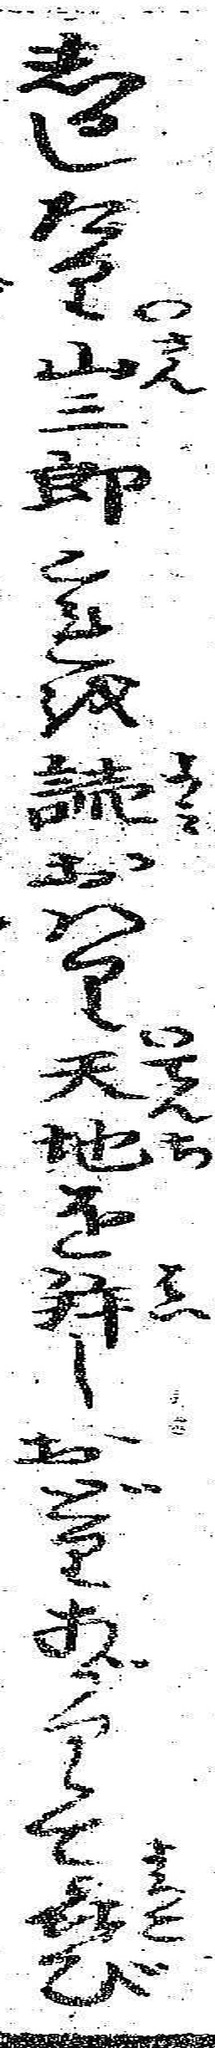しるしたり。山三郎これを読おはり。天地を拝しおどりあがりて㐂び
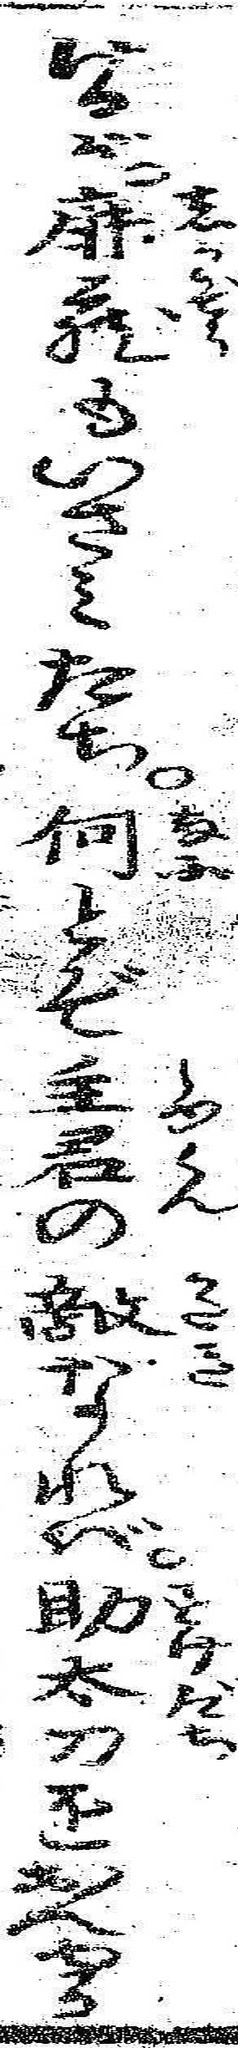けるが。鹿蔵もいさみたち。何とぞ主君の敵なれば。助太刀をおんゆる
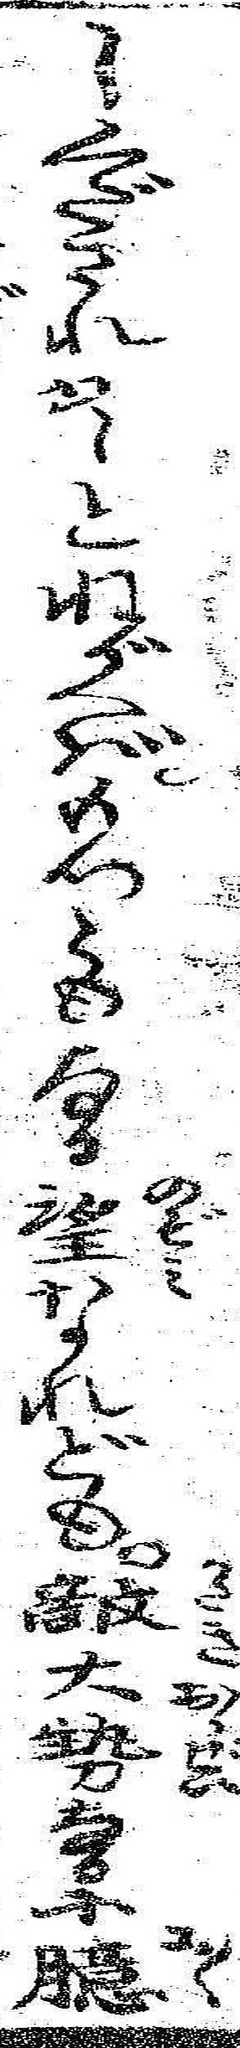しくだされかしとねがへば。もつともなる望なれども。敵大勢なるに臆
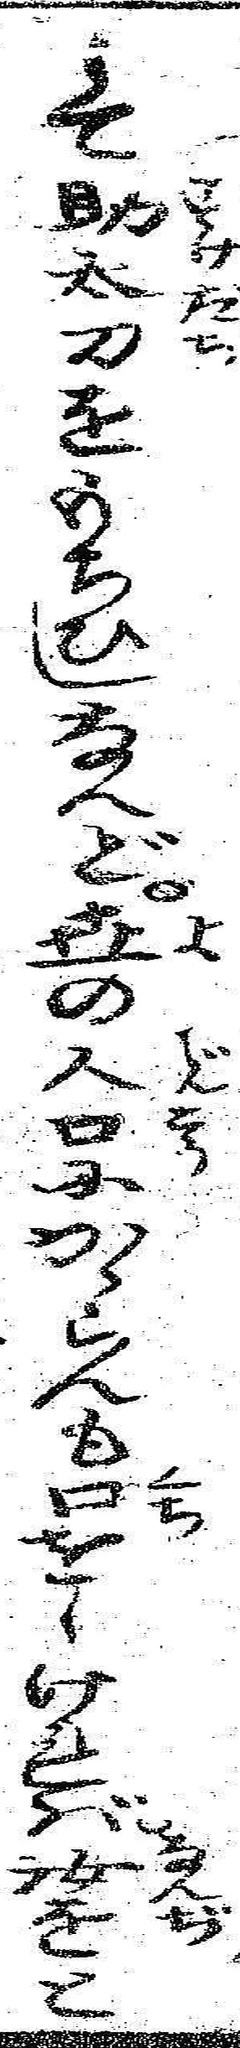して助太刀をもちひしなんど。世の人口にかゝらんも口をしければ汝をと
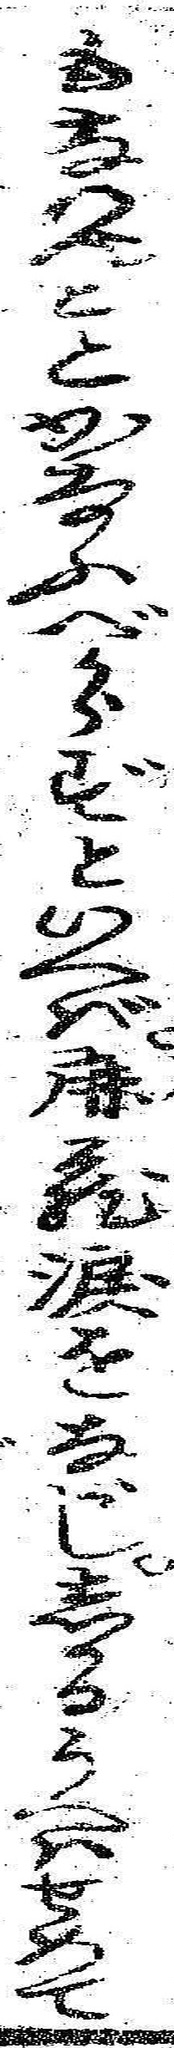もなはんことかなふべからずといへば。鹿蔵涙をながし。しかるうへはせめて
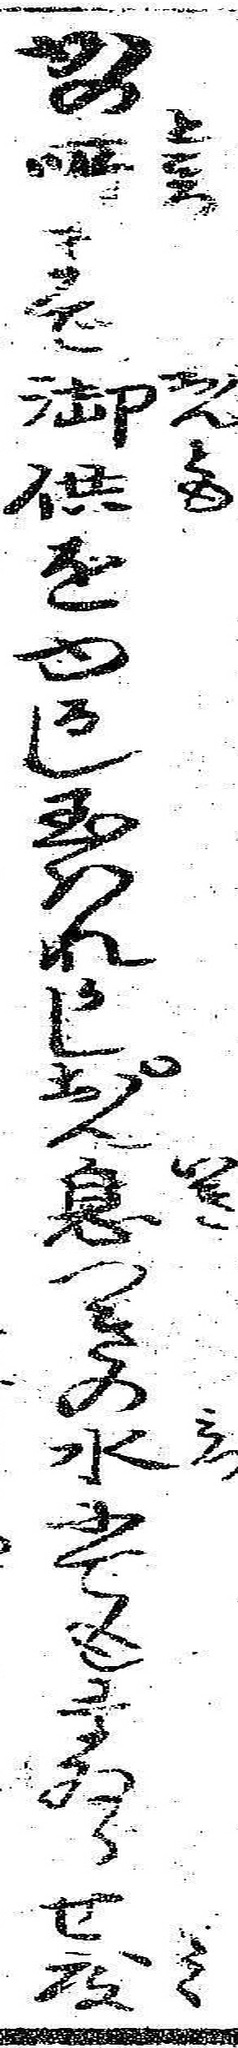かの所まで御供をゆるし玉はれかし。おん息つきの水にてもまゐらせ度
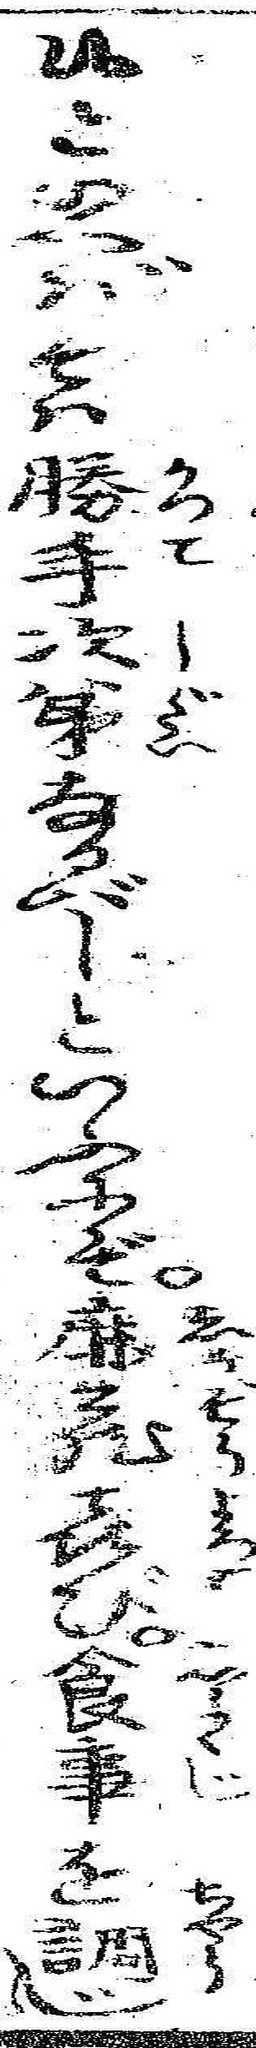候といへばそは勝手次第なるべしといふにぞ。鹿蔵喜び。食事を調じ
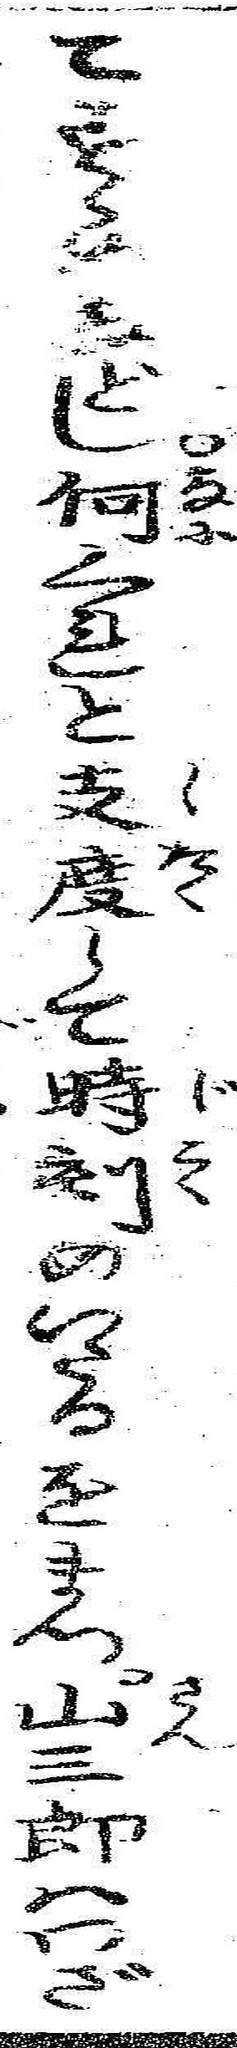てすゝめなどし。何くれと支度して時刻のいたるをまつ。山三郎はわざ
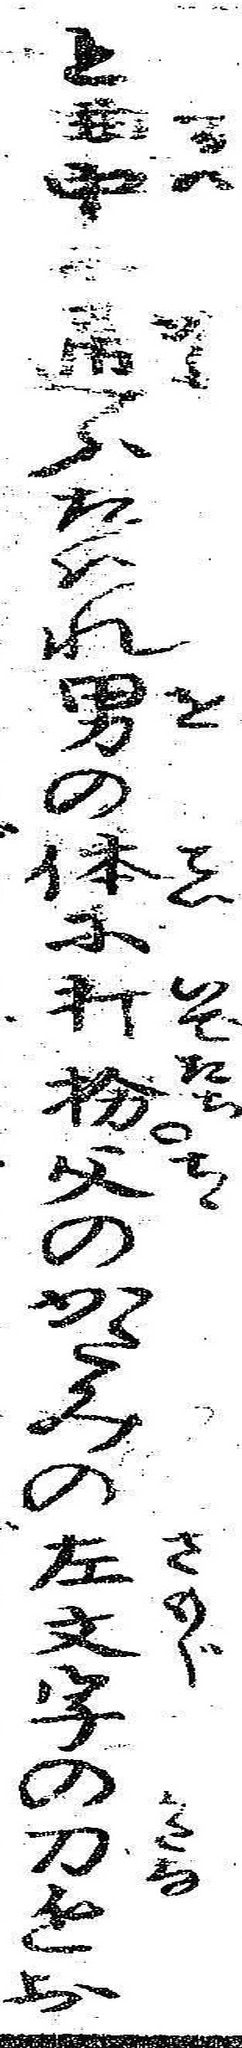と曲中に通ふたはれ男の体に打扮。父のかたみの左文字の刀をお
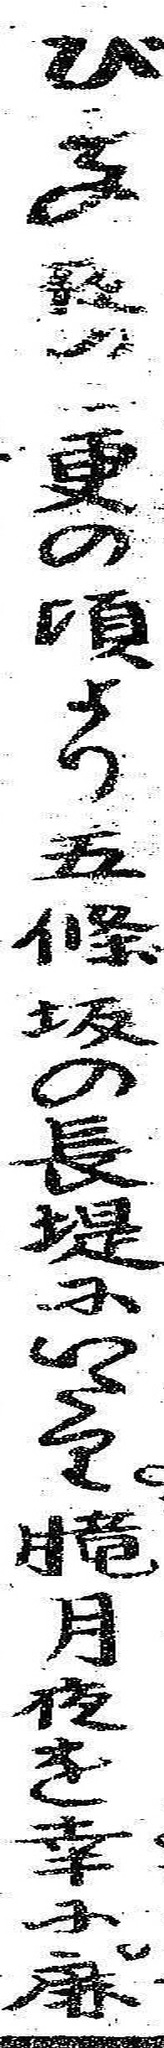びその夜の二更の頃より五条坂の長堤にいたり。朧月夜を幸に。鹿
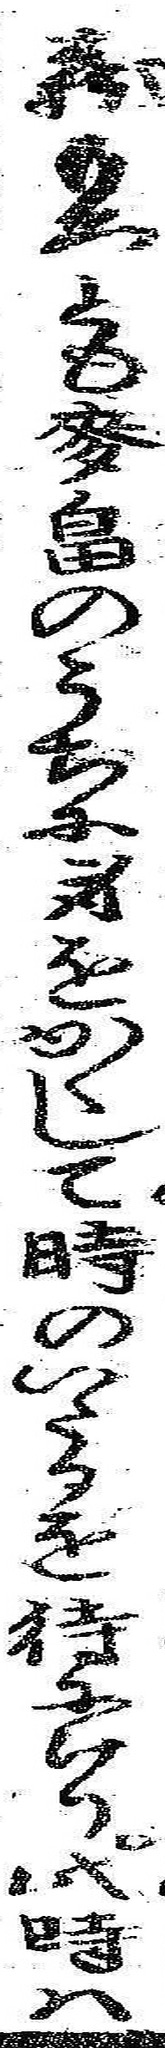蔵もろとも麦畠のうちに身をかくして。時のいたるを待にけり。此時は
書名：昔話稲妻表紙
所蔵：国文学研究資料館
